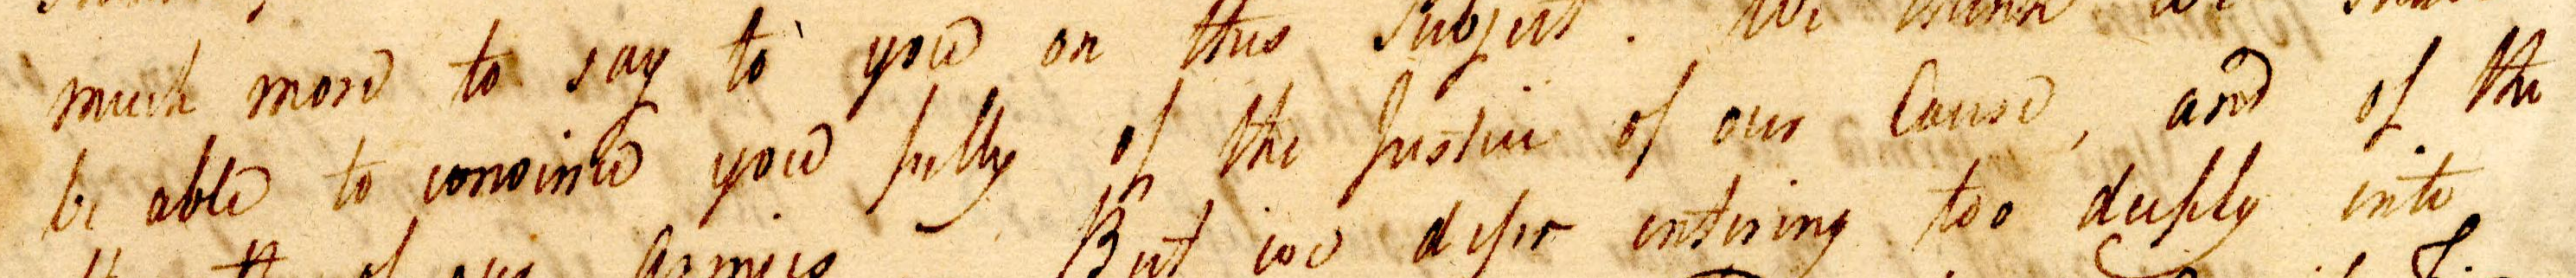be able to convince you fully of the Justice of our Cause, and of the
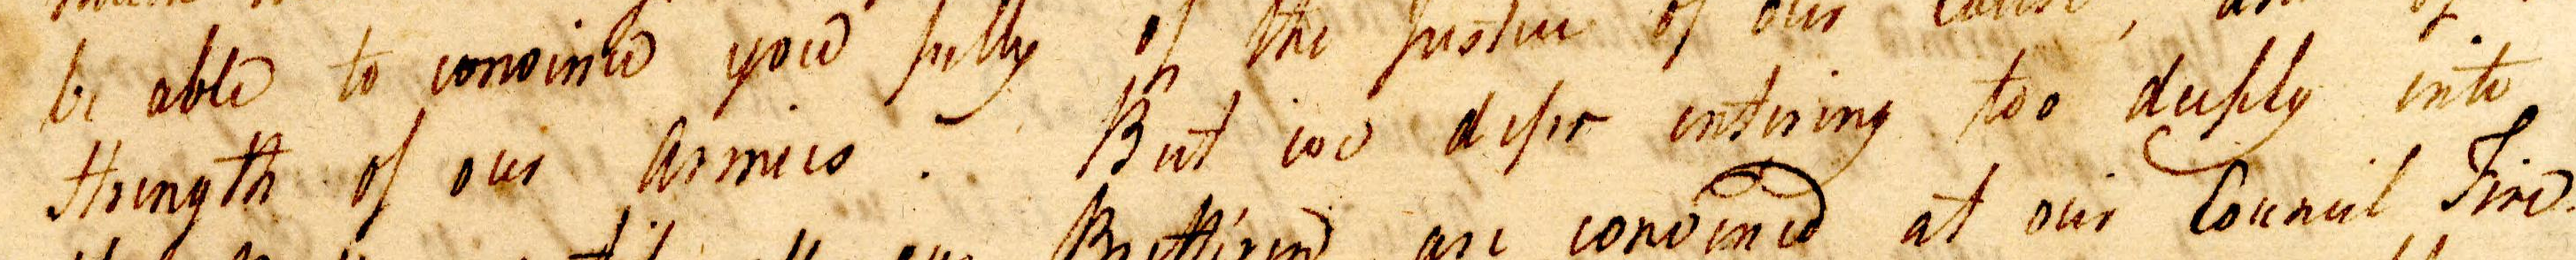strength of our Armies. But we defer entering too deeply into
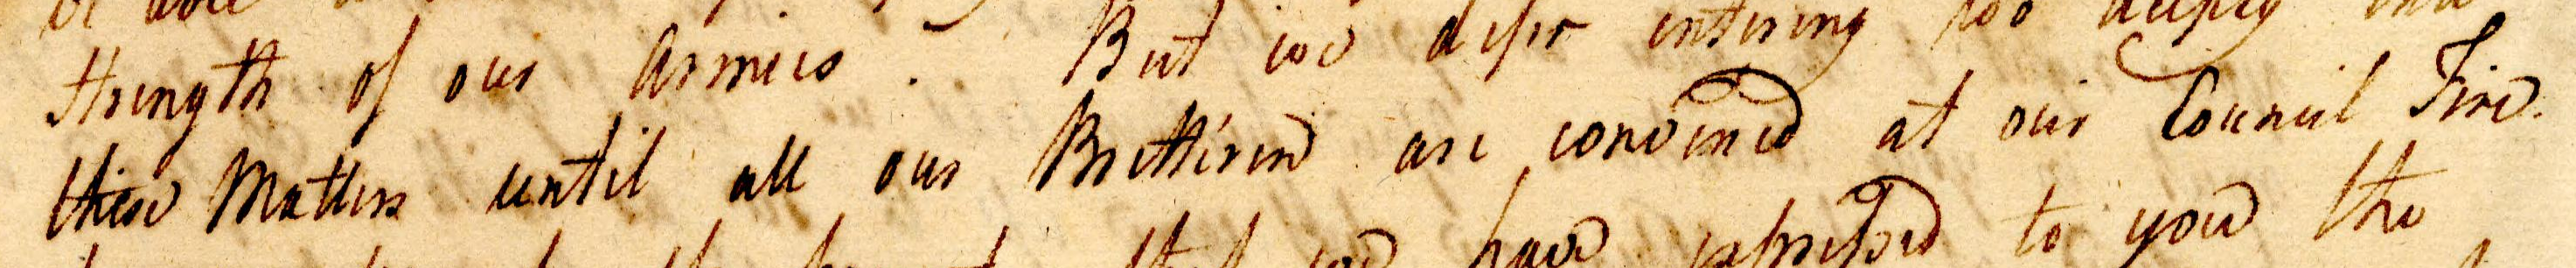these Matters until all our Bretheren are convened at our Council Fire.
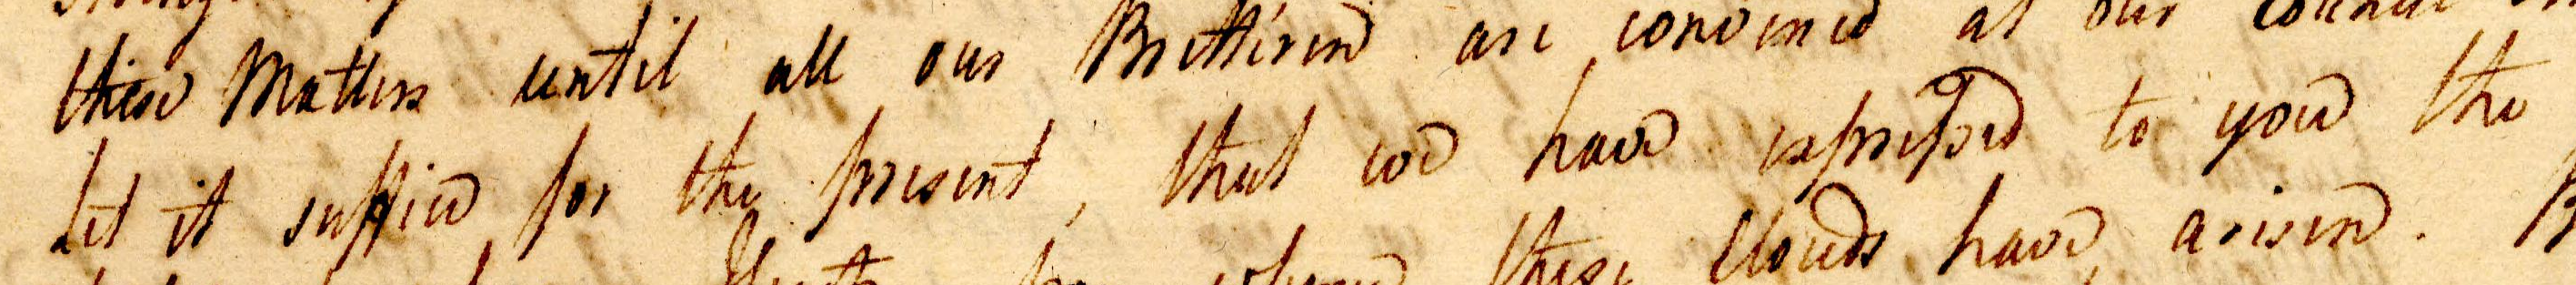Let it suffice for the present, that we have expressed to you the
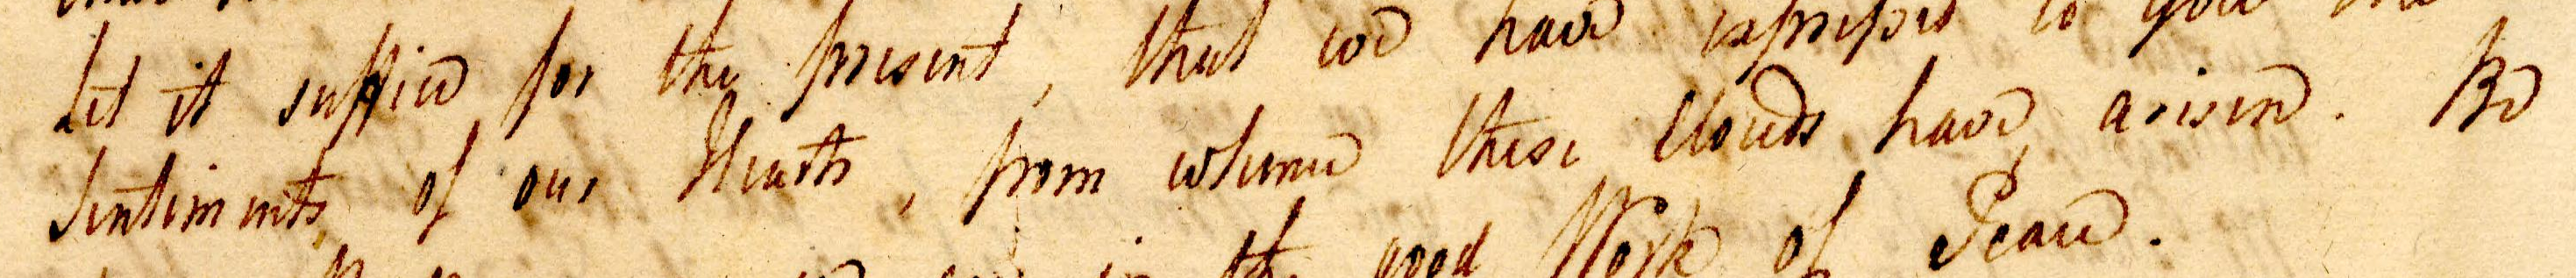Sentiments of our Hearts, from whence these Clouds have arisen. Be
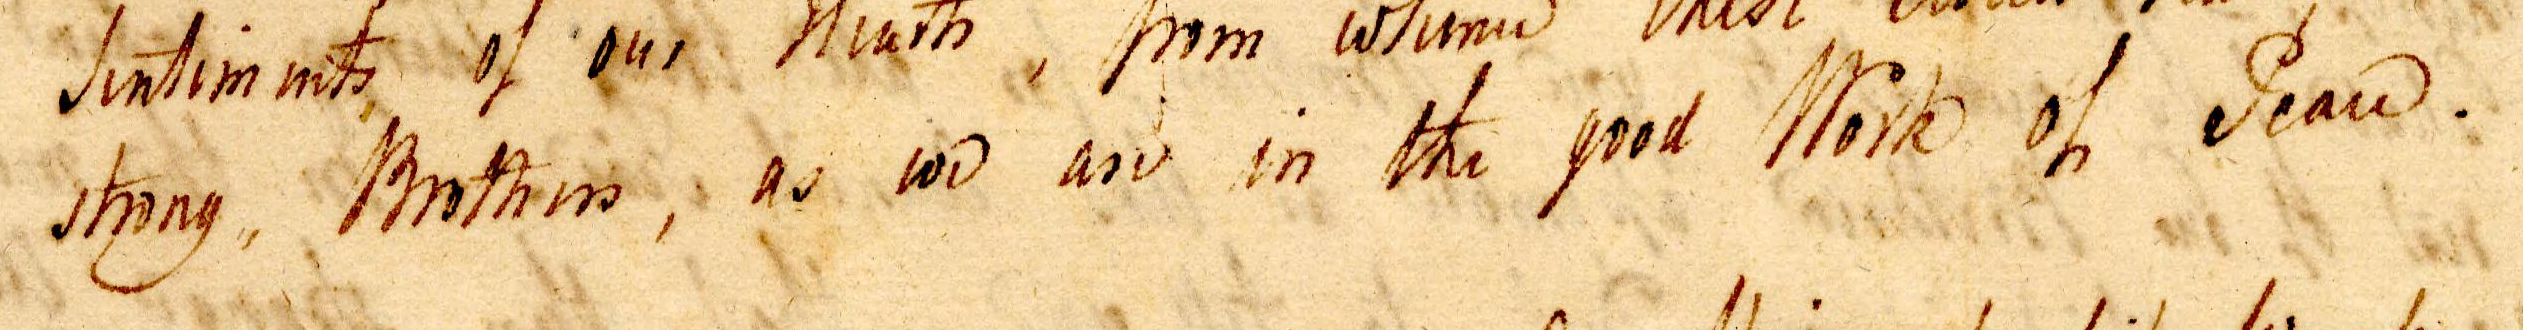strong, Brothers, as we are in the good Work of Peace.
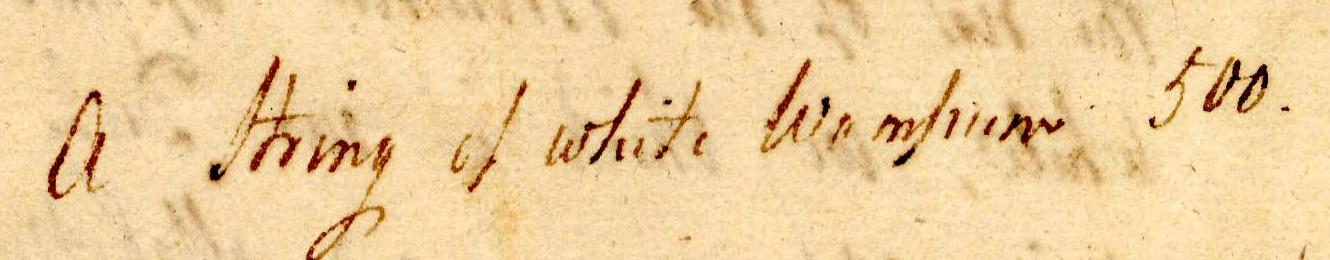A String of white Wampum 500.
